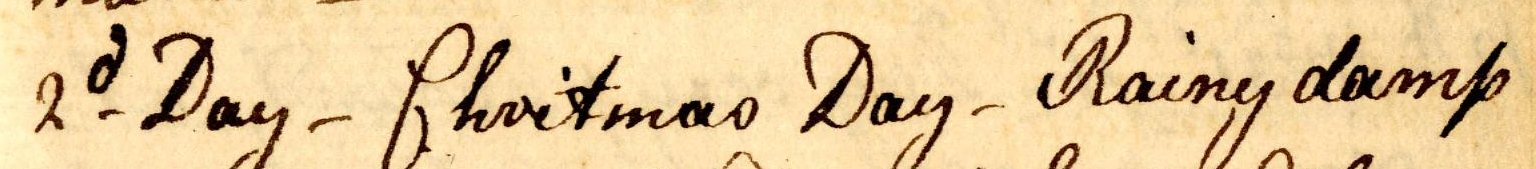2^d Day- Christmas Day- Rainy damp
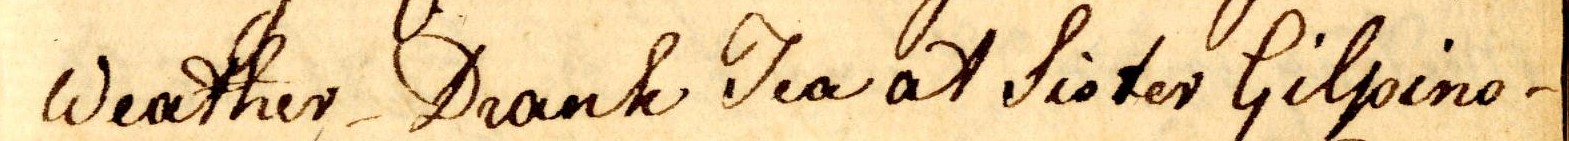Weather- Drank Tea at Sister Gilpins-
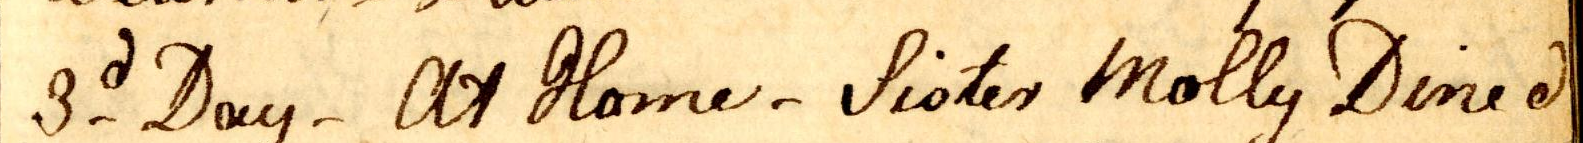3^d Day- At Home- Sister Molly Dined
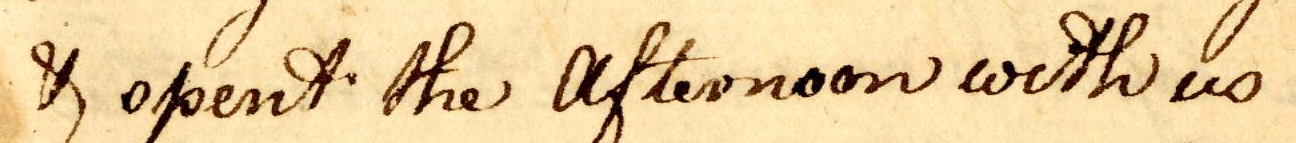& spent the Afternoon with us
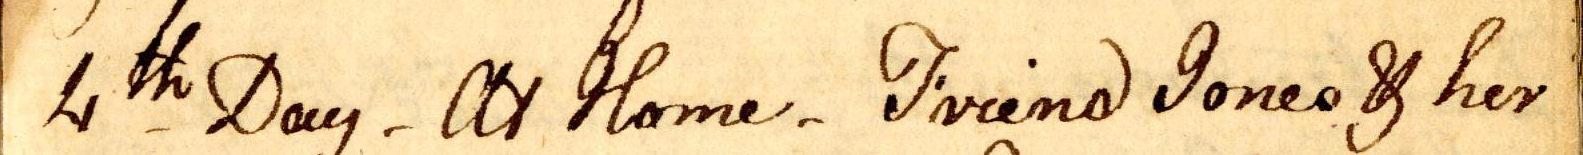4^th Day- At Home- Friend Jones & her
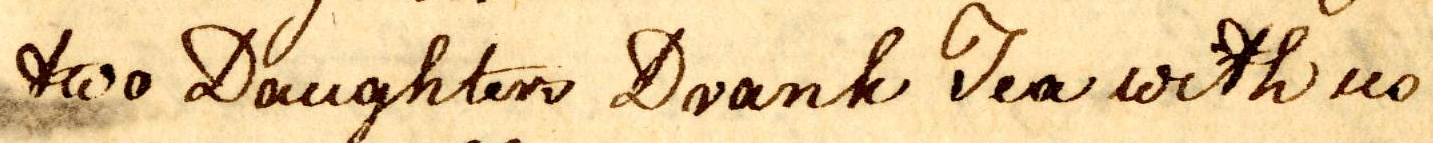two Daughters Drank Tea with us
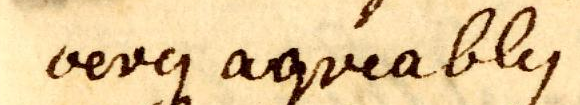very agreably
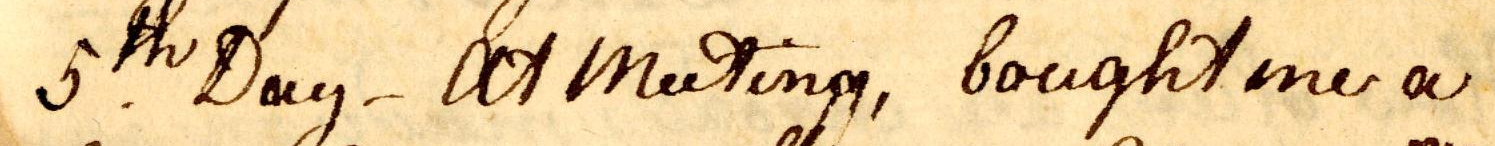5^th Day- At Meeting, bought me a
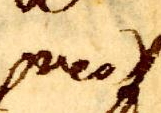rest
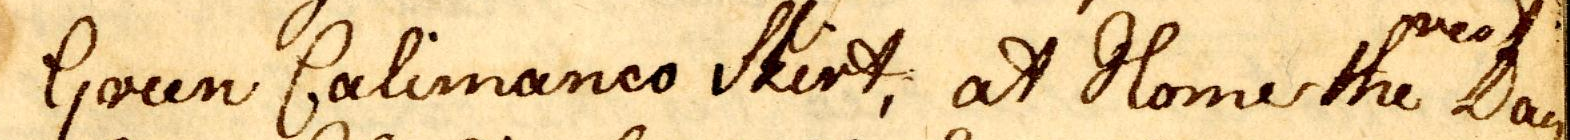Green Calimanco Skirt, at Home the Day
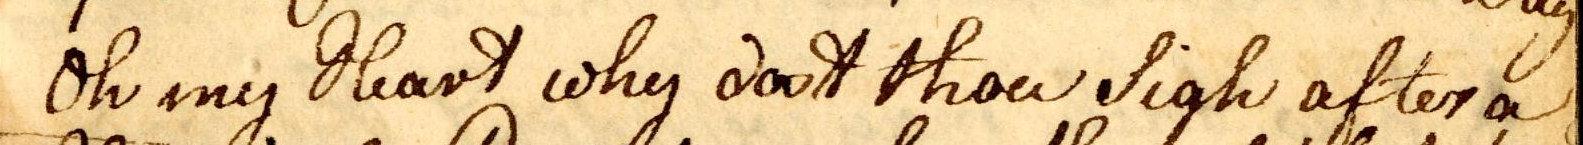Oh my Heart why dost thou Sigh after a
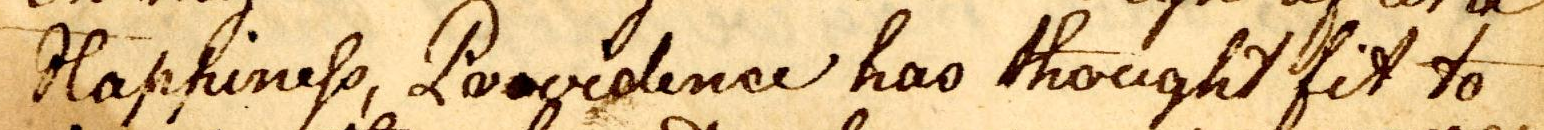Happiness, Providence has thought fit to
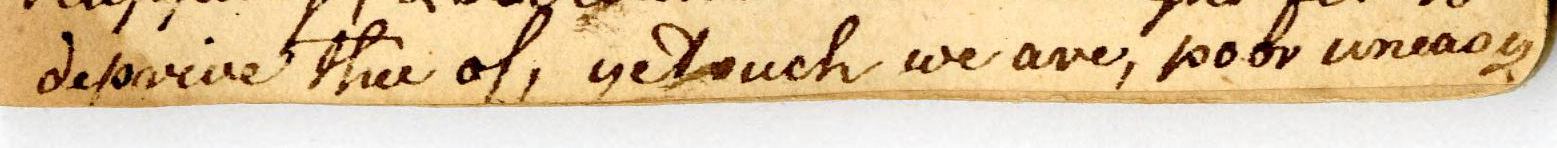deprive thee of, yet such we are, poor uneasy
